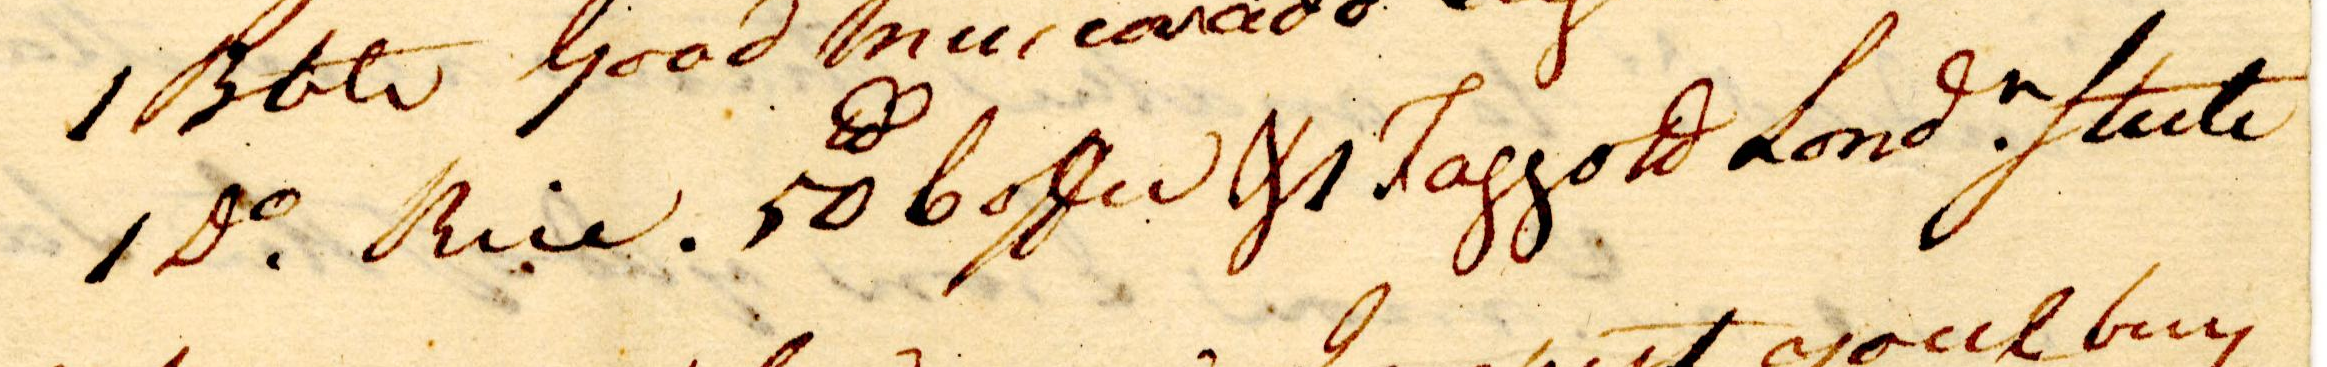1 D^o Rice, 50^lb Coffee & 1 Taggold Lond^n. Fleece
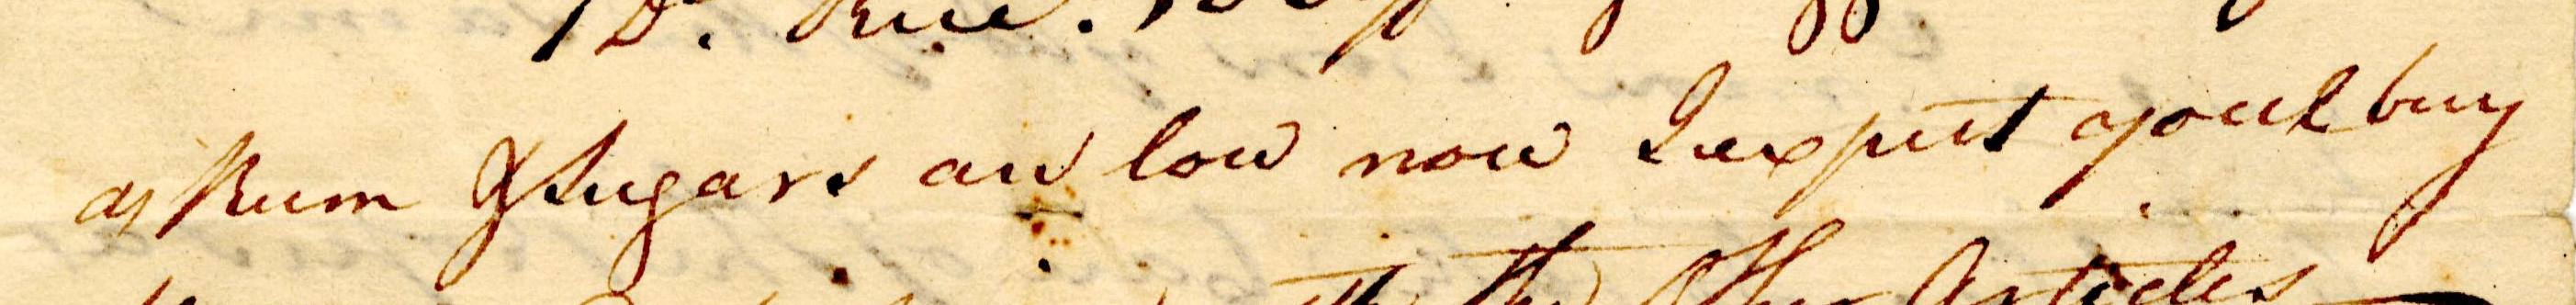as Rum & Sugars are low now I expect youl buy
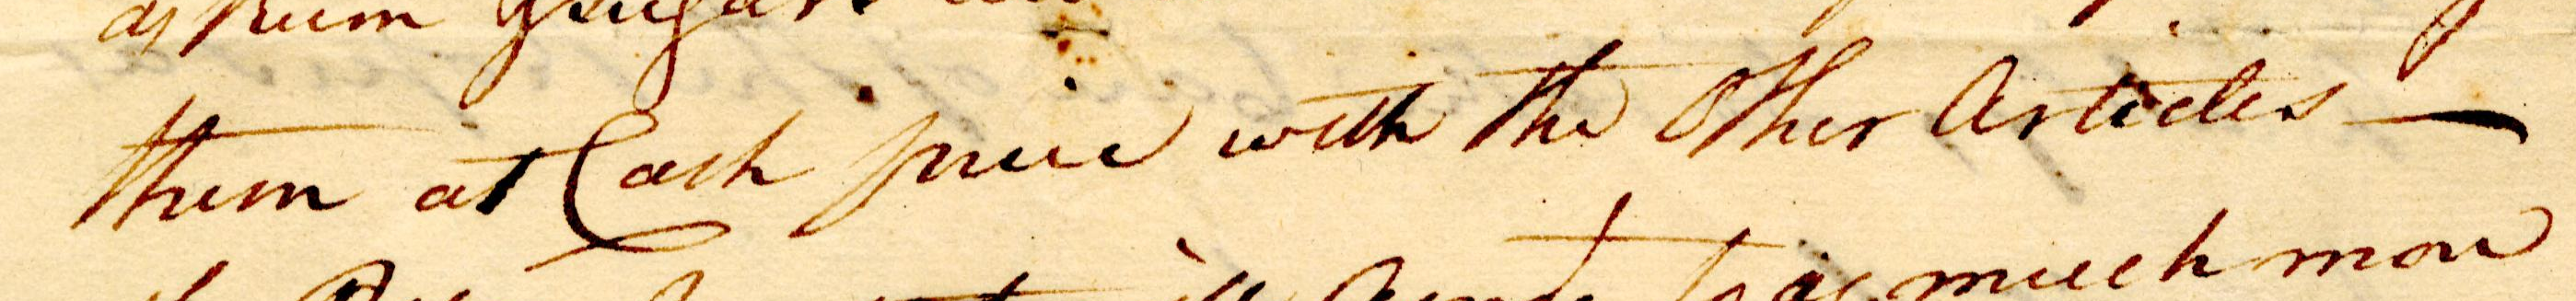them at Cash price with the other Articles-
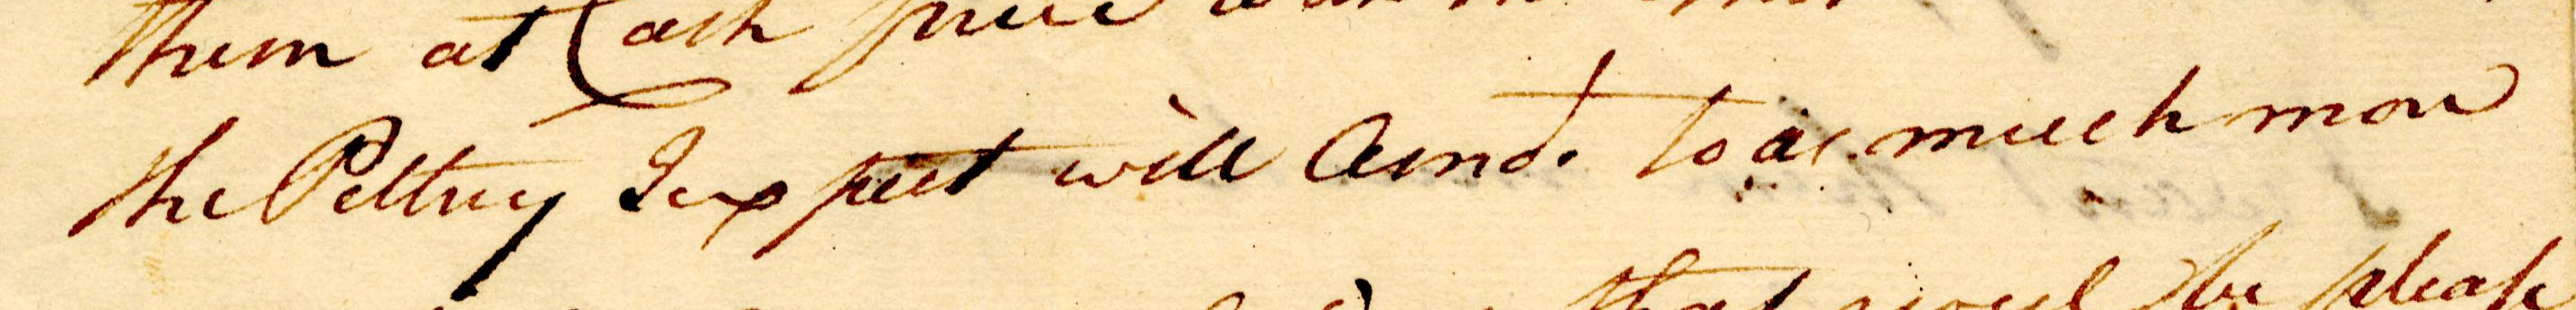the Pottry I expect will Am^t. To as much more
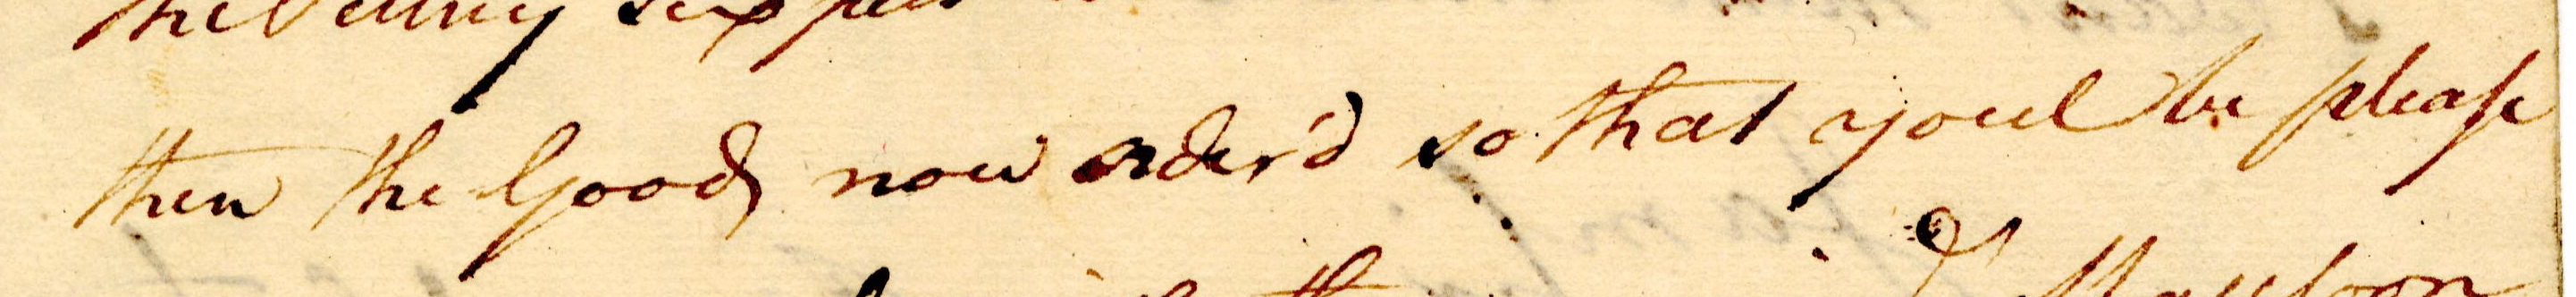then the Goods now order'd so that youl be please
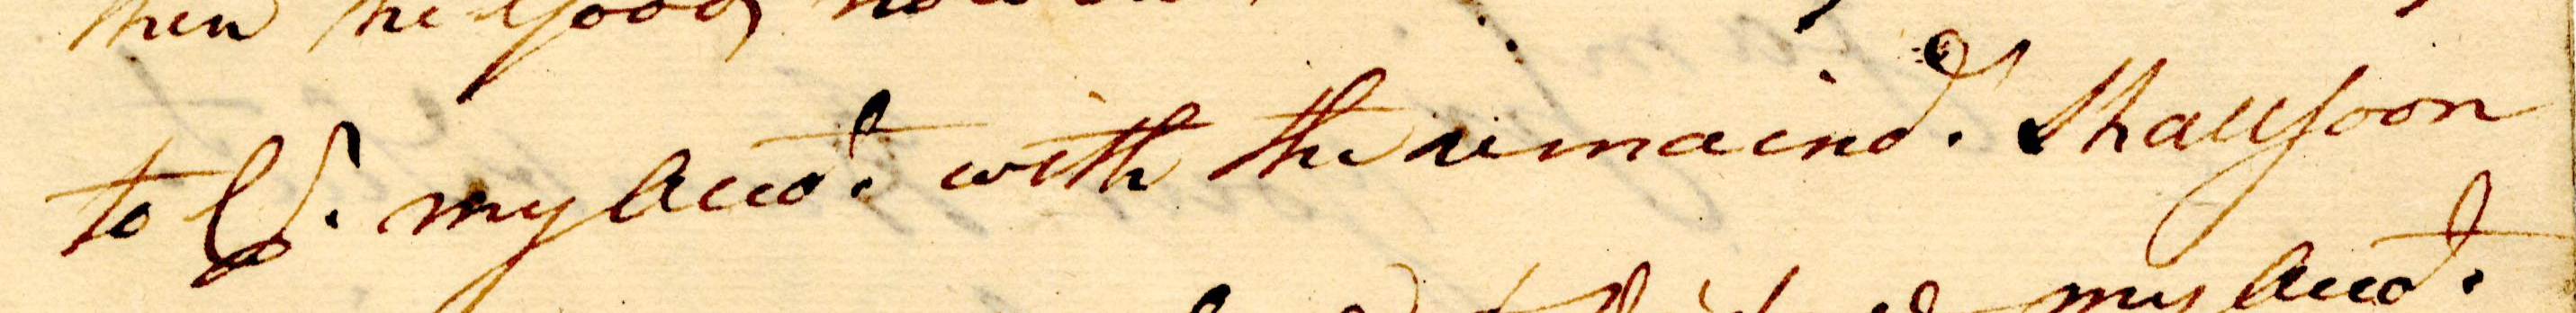to C^t. my Acco^t with the remaind^r. Shall soon
